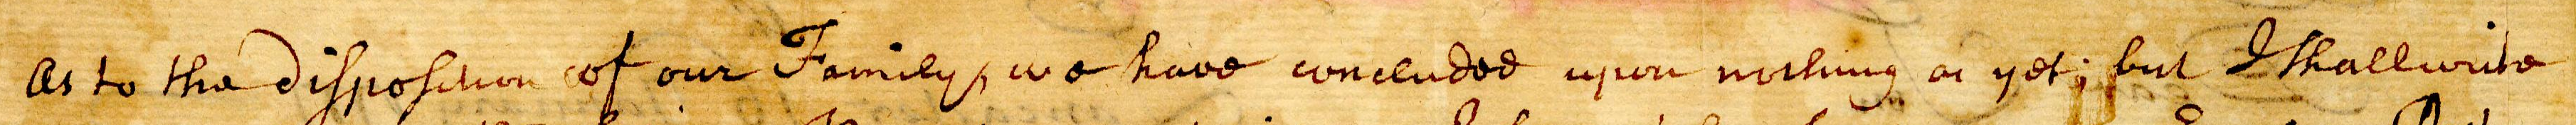As to the disposetion of our Family, we have concluded upon nothing as yet; but I shall write
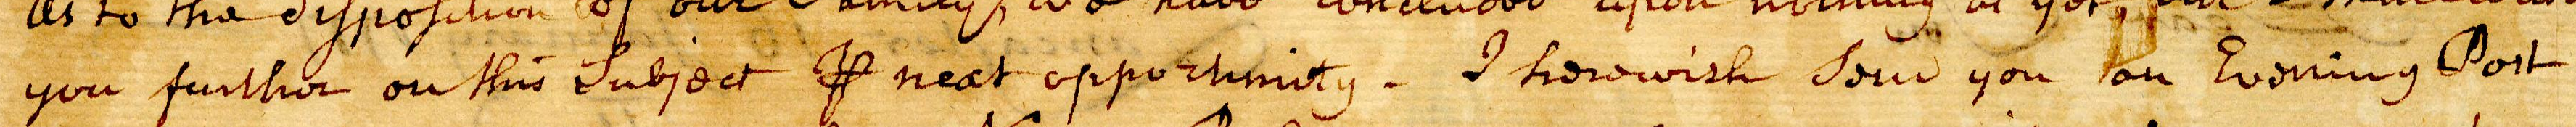you further on this subject per next opportunity- I herewith send you an Evening Post
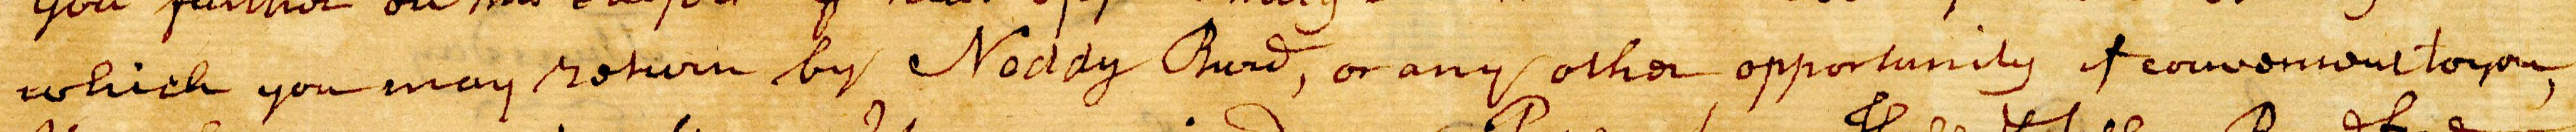which you may return by Noddy Burd, or any other opportunity if convenient to you
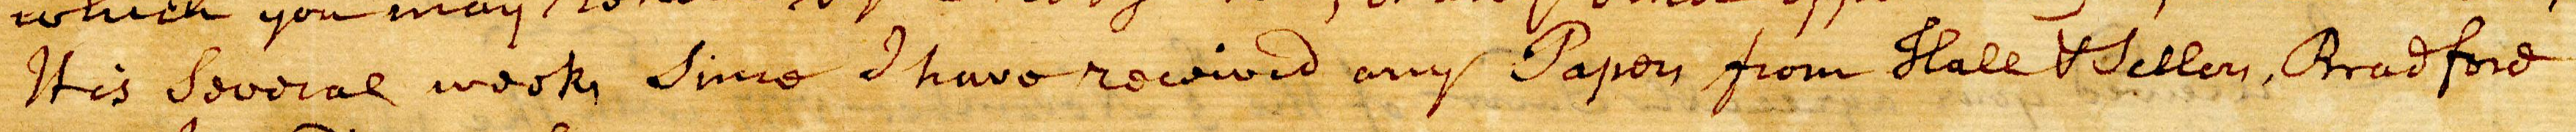It is several weeks since I have received any Papers from Hall & Sellers, Bradford
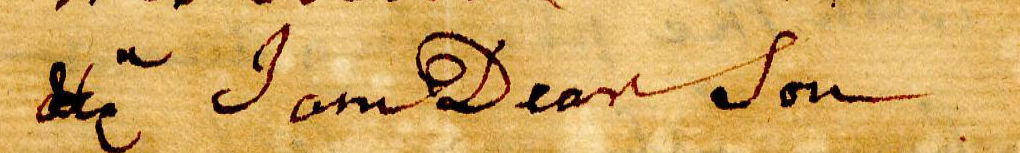&c I am Dear Son
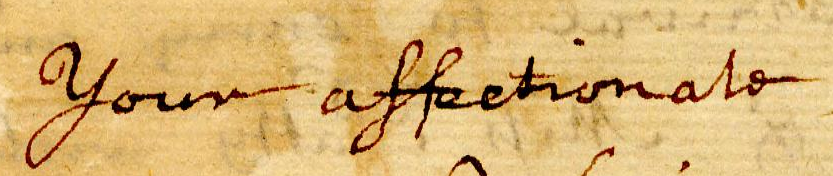Your affectionate
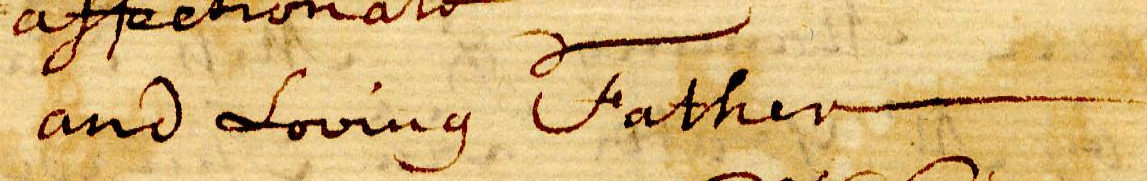and Loving Father
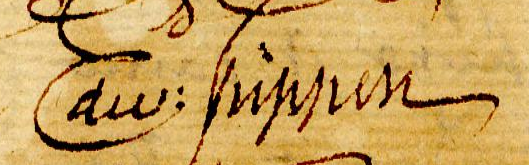Edw^d: Shippen
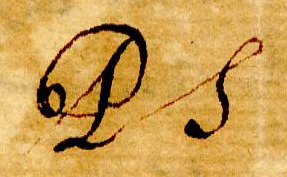PS
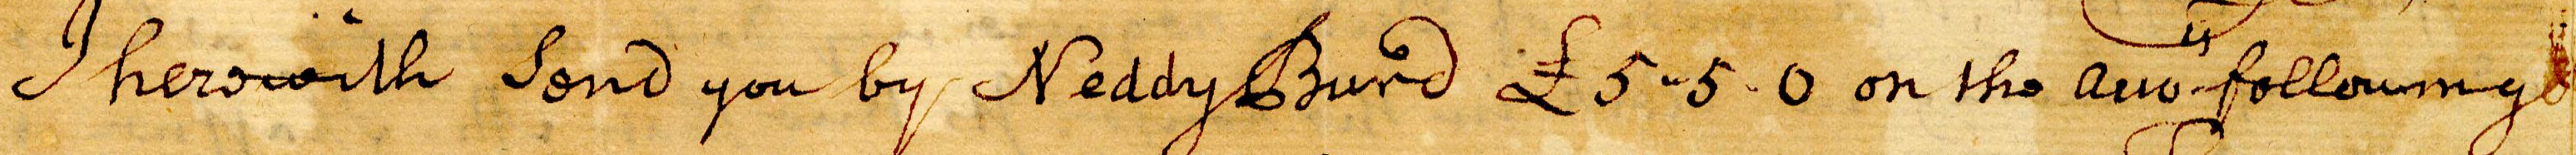I herewith send you by Neddy Burd £5-5-0 on the Acco^ts. following
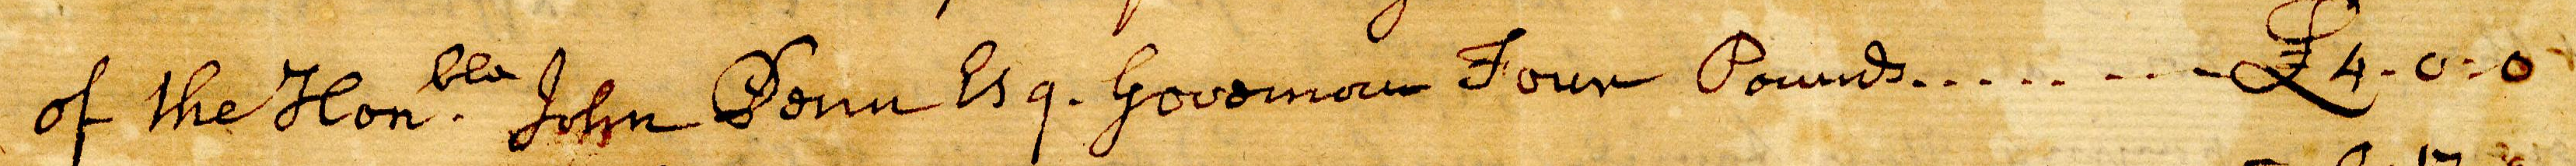of the Hob^ble. John Penn Esq. Governor Four Pounds.........£4.0..0
